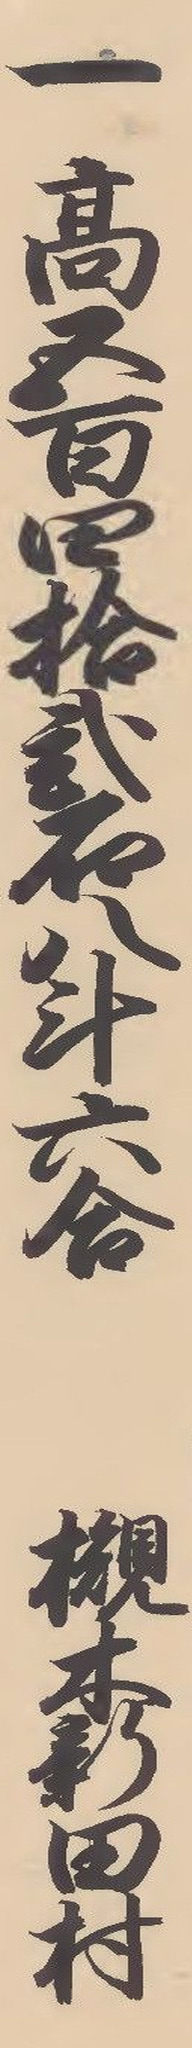一高五百四拾弐石八斗六合槻木新田村
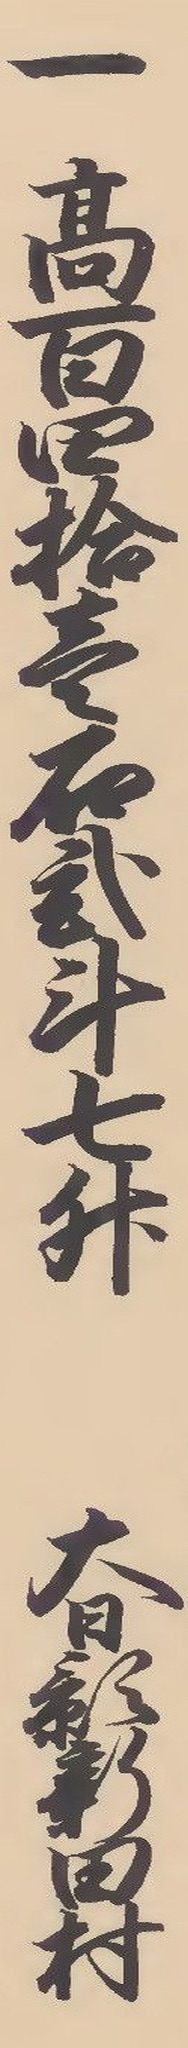一高百四拾壱石弐斗七升大日影新田村

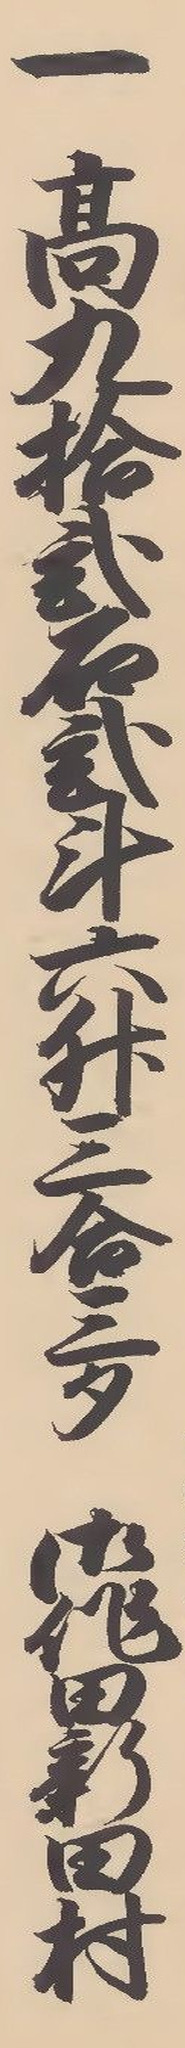一高九拾弐石弐斗六升三合三勺御作田新田村
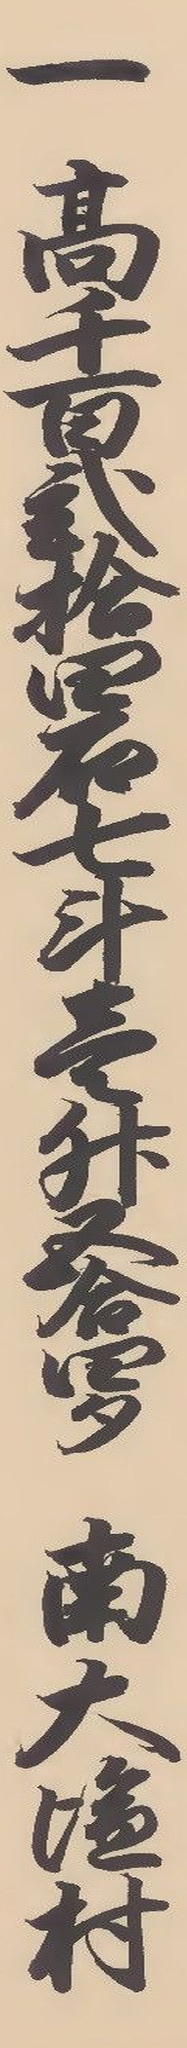一高千百弐拾四石七斗壱升五合四勺南大塩村
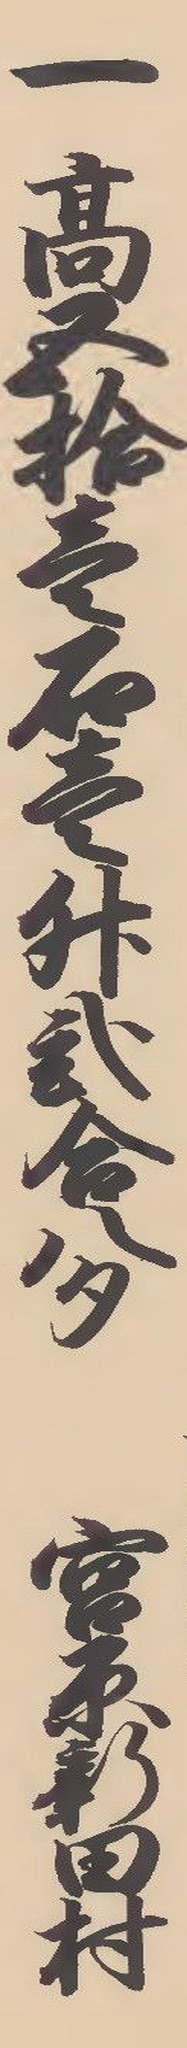一高五拾壱石壱升弐合八勺宮原新田村
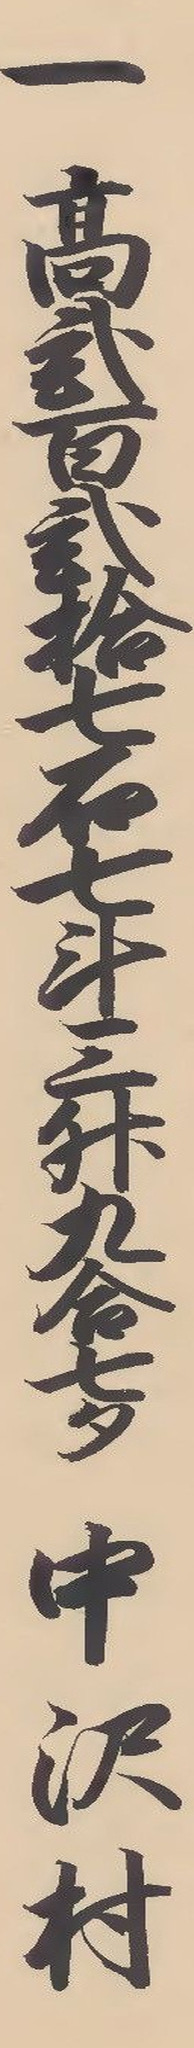一高弐百弐拾七石七斗三升九合七勺中沢村
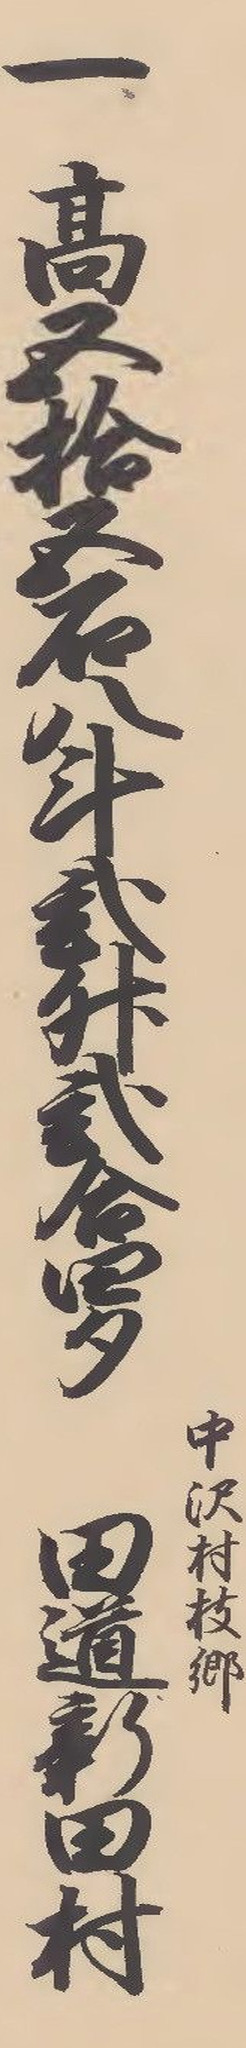一高五拾五石八斗弐升弐合四勺田道新田村
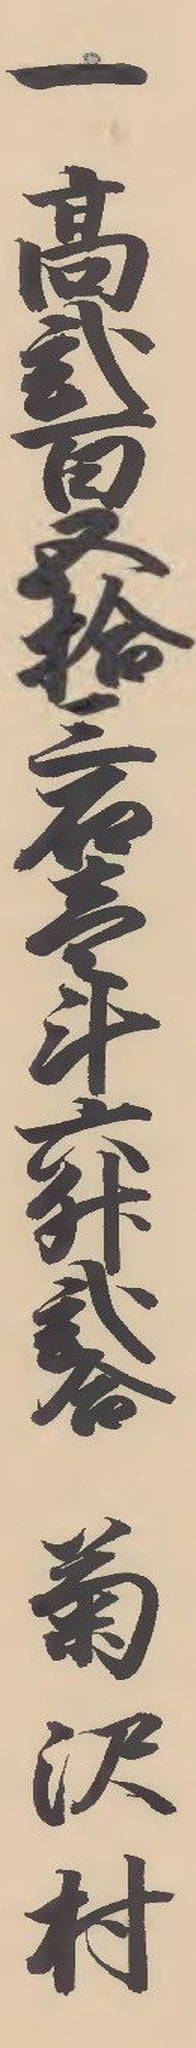一高弐百五拾三石壱斗六升弐合菊沢村
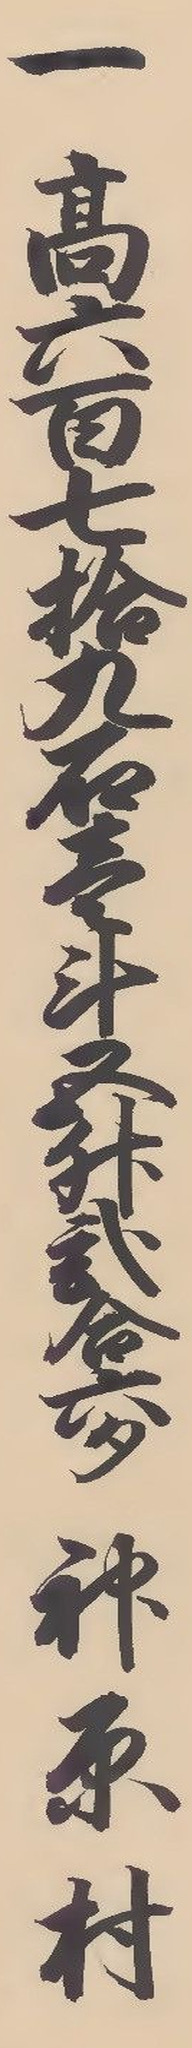一高六百七拾九石壱斗五升弐合六勺神原村

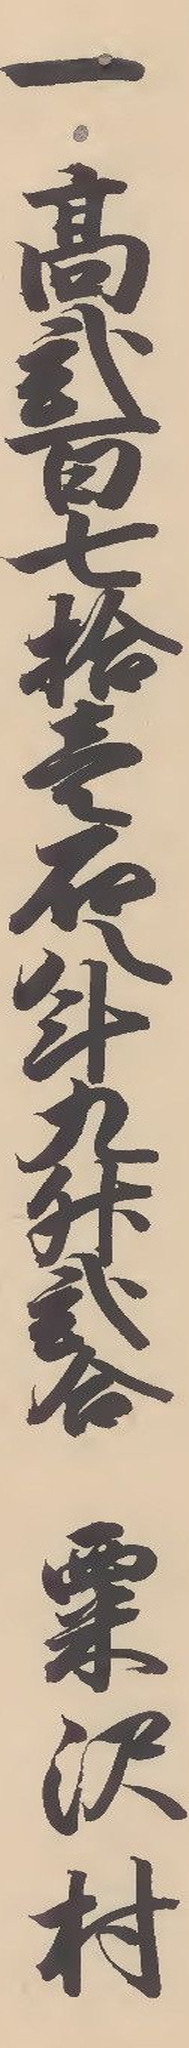一高弐百七拾壱石八斗九升弐合粟沢村
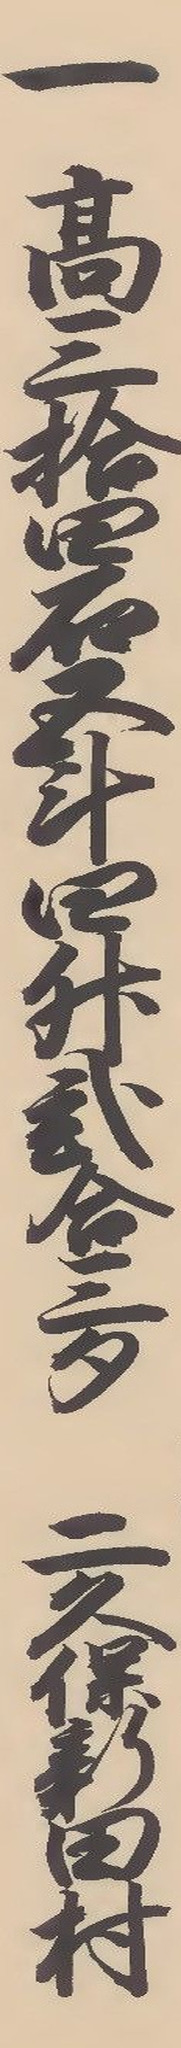一高三拾四石五斗四升弐合三勺二久保新田村
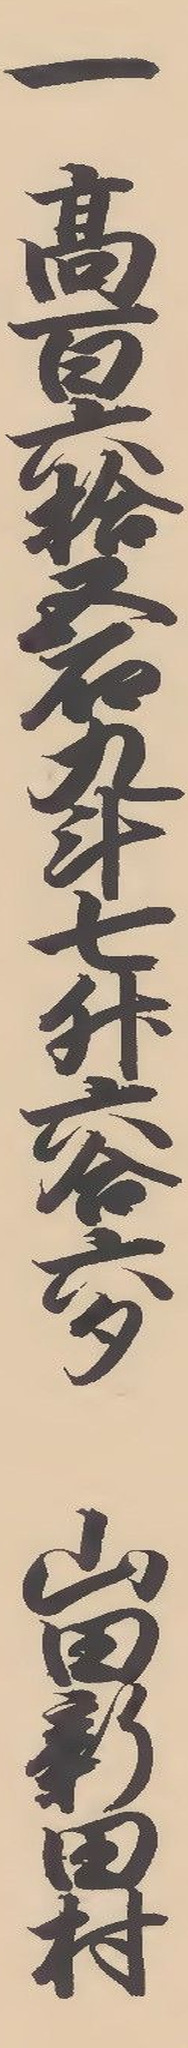一高百六拾五石九斗七升六合六勺山田新田村
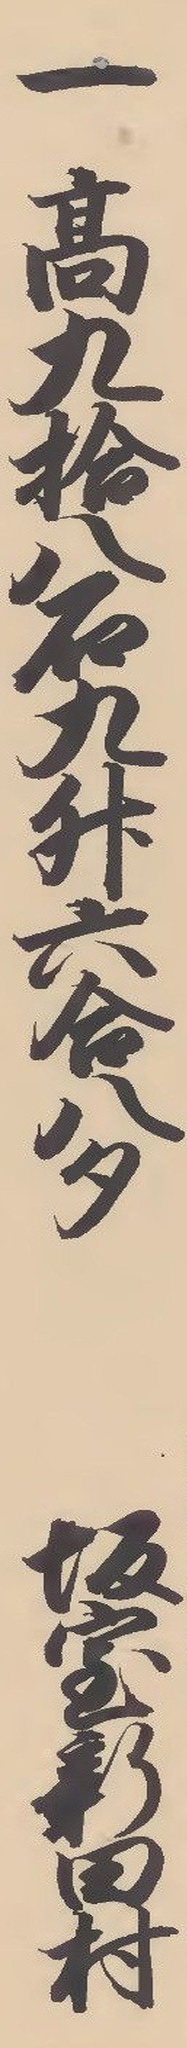一高九拾八石九升六合八勺坂室新田村
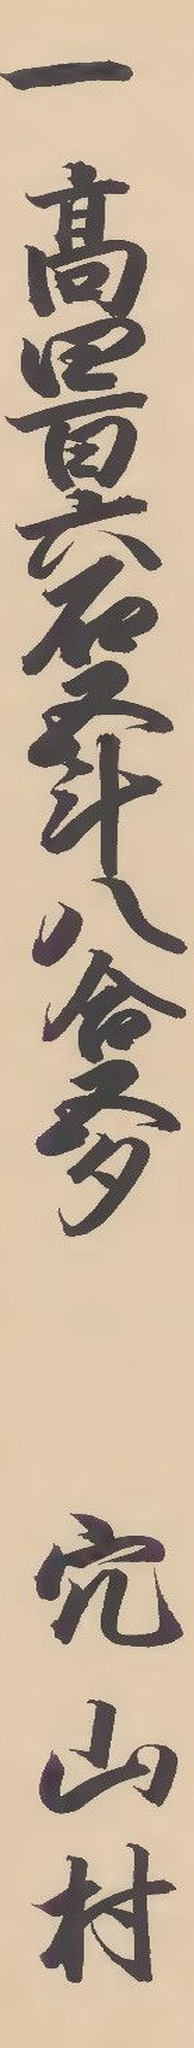一高四百六石五斗八合五勺穴山村

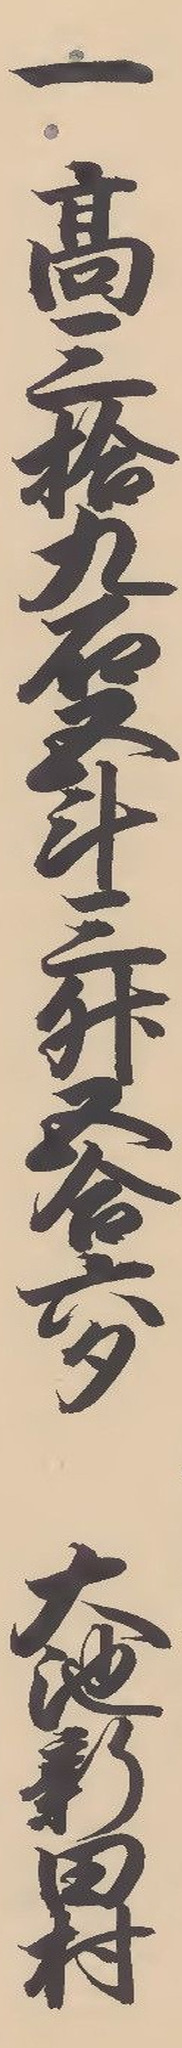一高三拾九石五斗三升五合六勺大池新田村
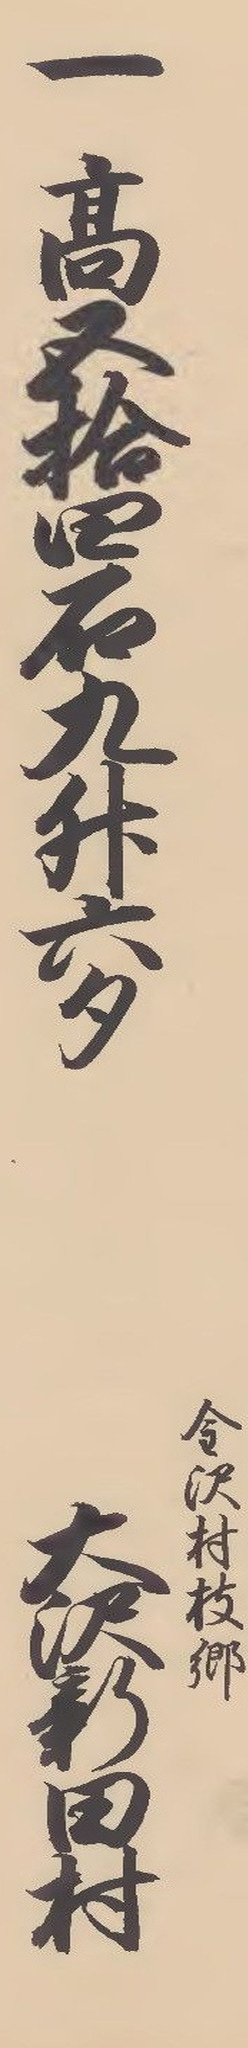一高五拾四石九升六勺大沢新田村
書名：信濃国郷帳
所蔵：国立公文書館 National Archives of Japan
